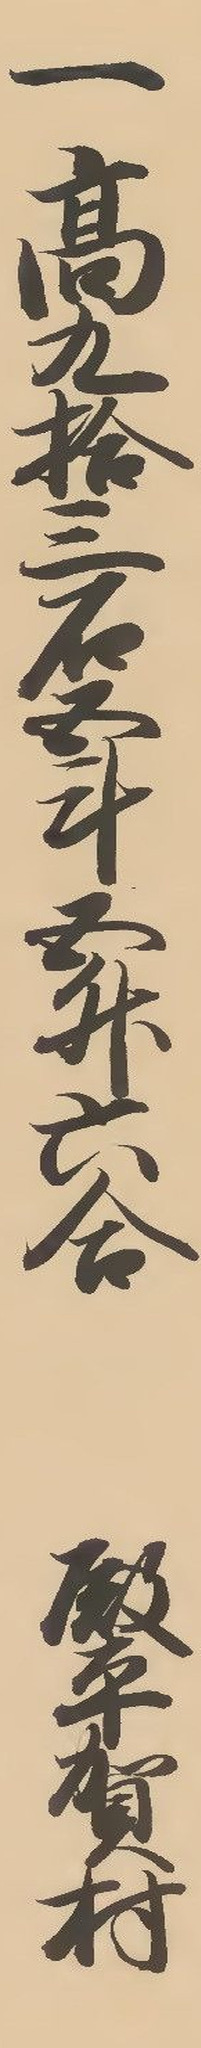一高九拾三石五斗五升六合殿平賀村
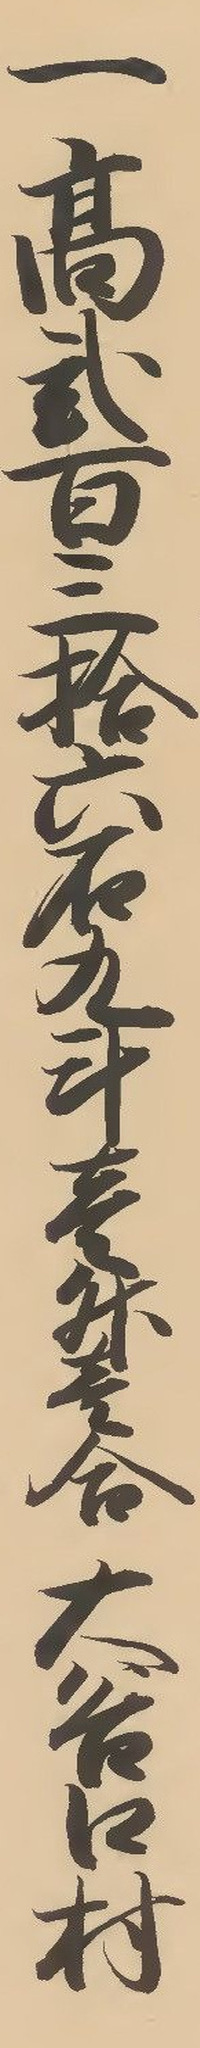一高弐百三拾六石九斗壱升壱合大谷口村
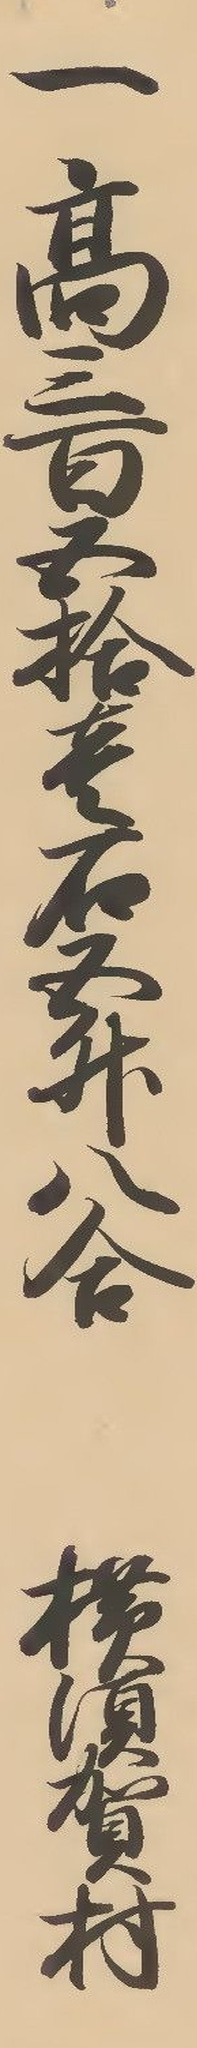一高三百五拾壱石五升八合横須賀村
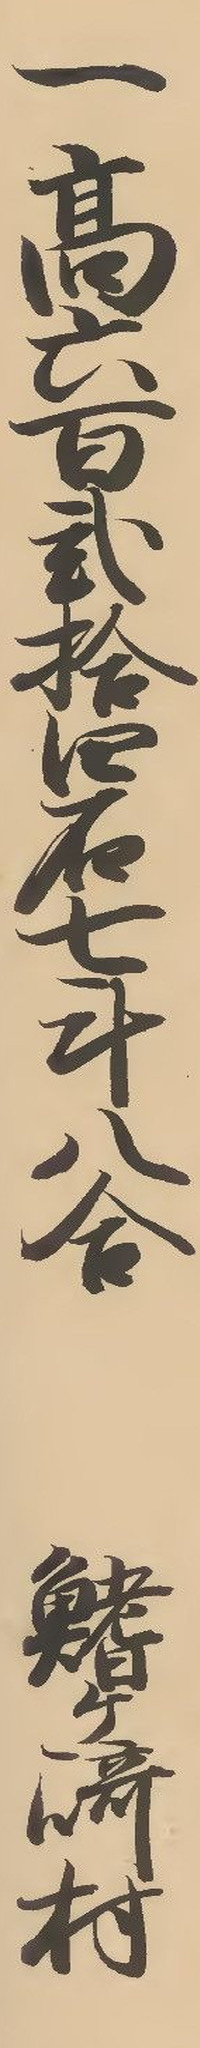一高六百弐拾四石七斗八合鰭ヶ崎村
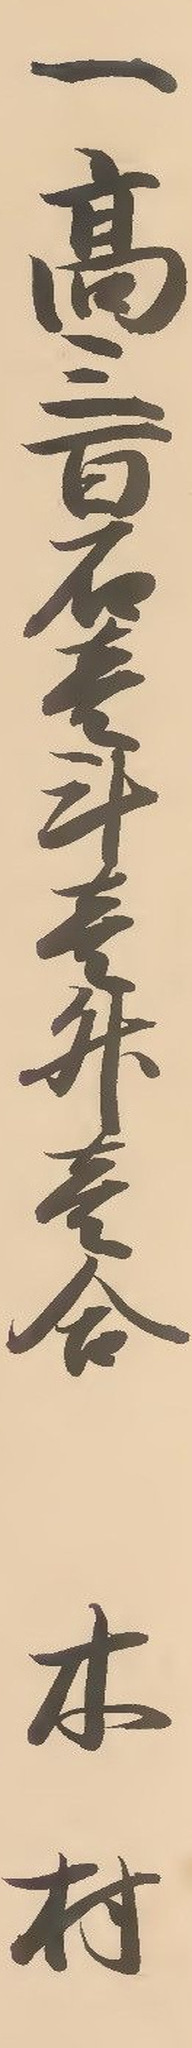一高三百石壱斗壱升壱合木村
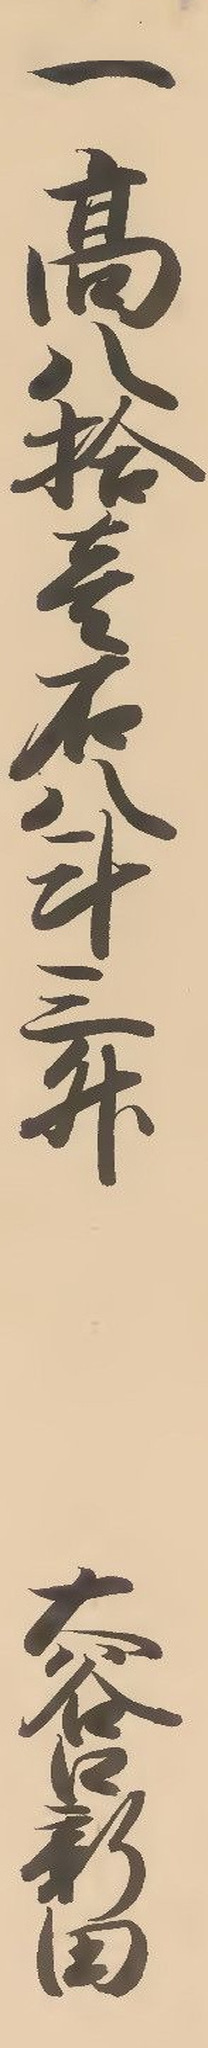一高八拾壱石八斗三升大谷口新田
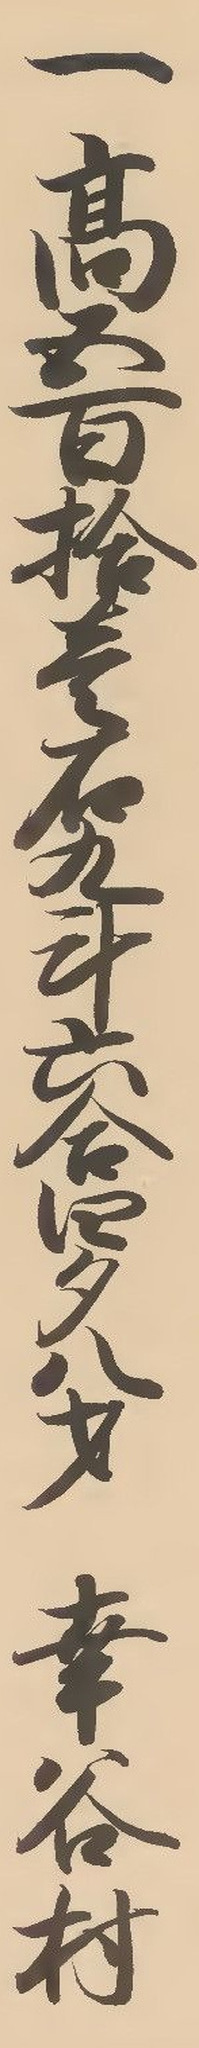一高五百拾壱石九斗六合四勺八才幸谷村
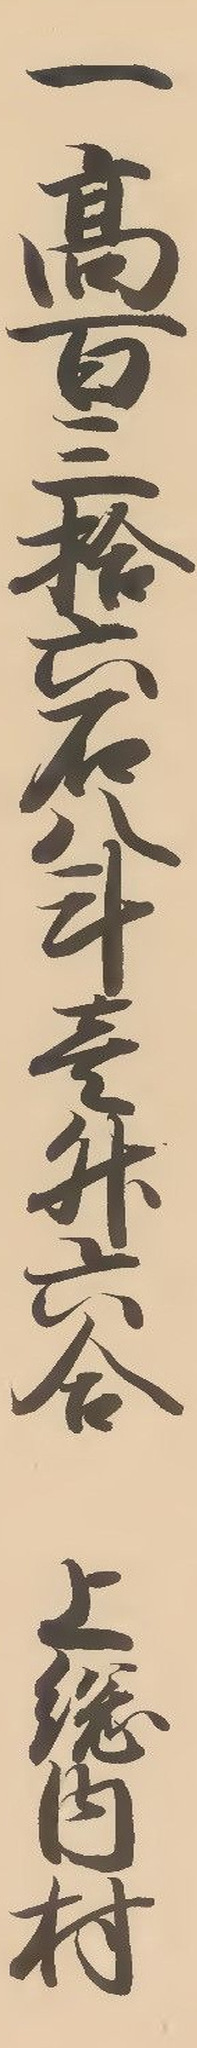一高百三拾六石八斗壱升六合上総内村

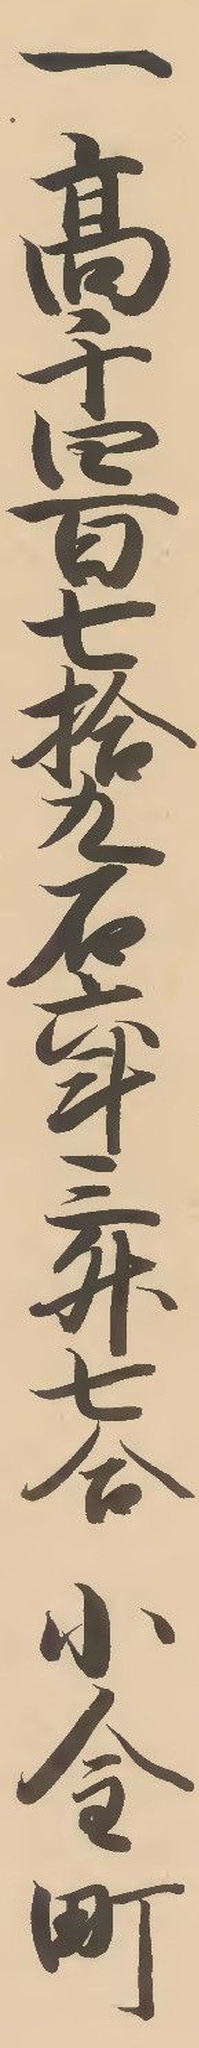一高千四百七拾九石六斗三升七合小金町
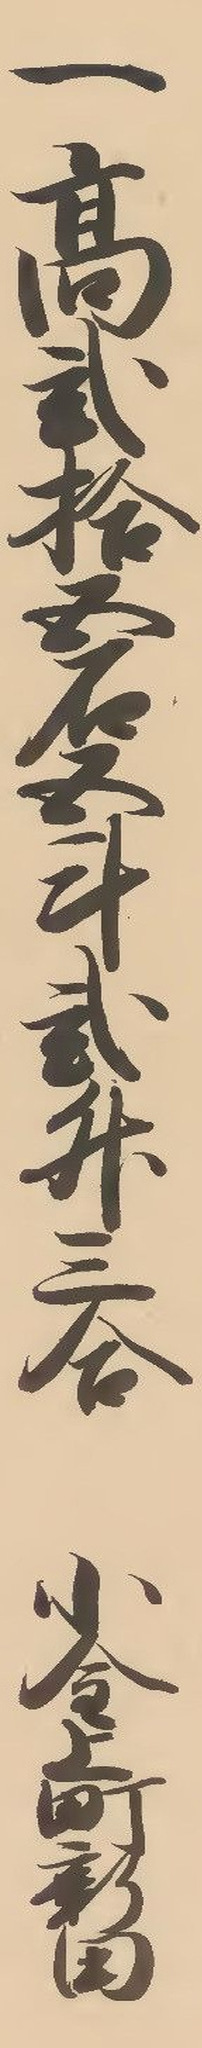一高弐拾五石五斗弐升三合小金上町新田
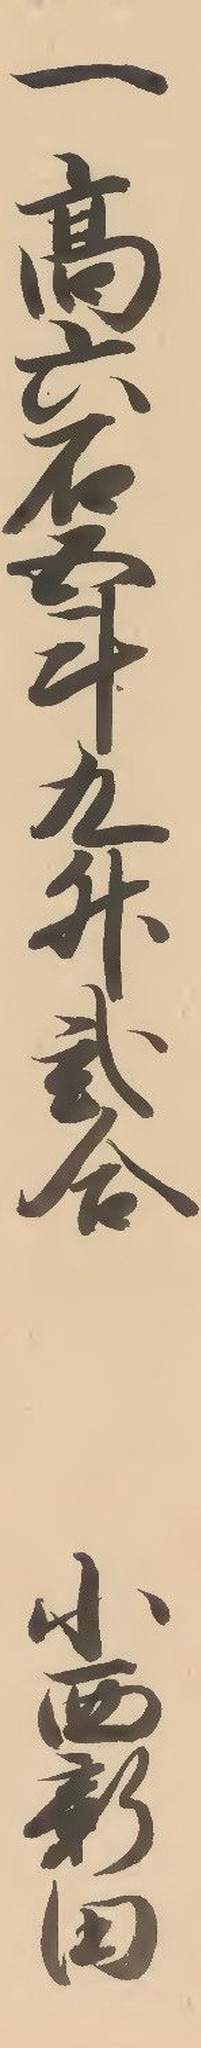一高六石五斗九升弐合小西新田
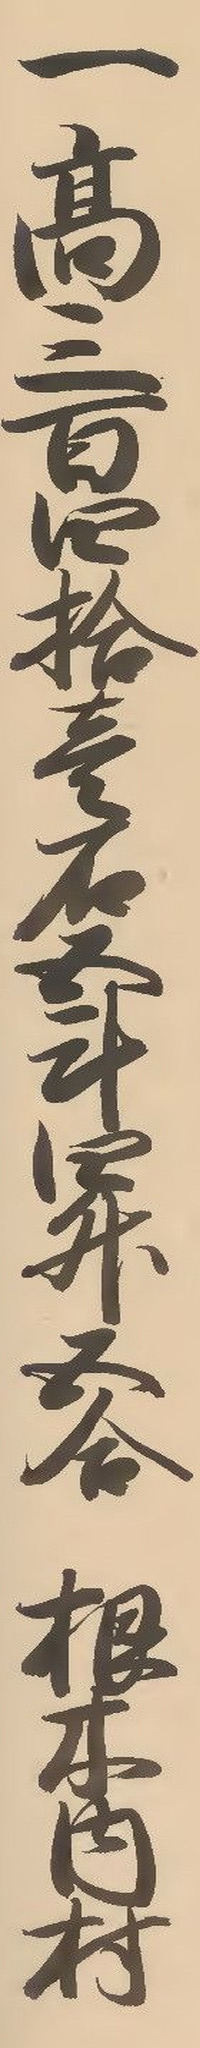一高三百四拾壱石五斗四升五合根木内村
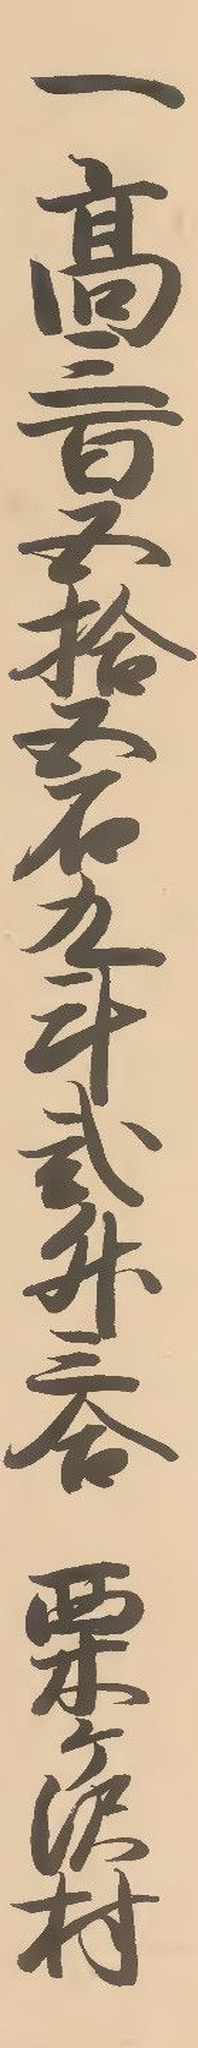一高三百五拾五石九斗弐升三合栗ヶ沢村
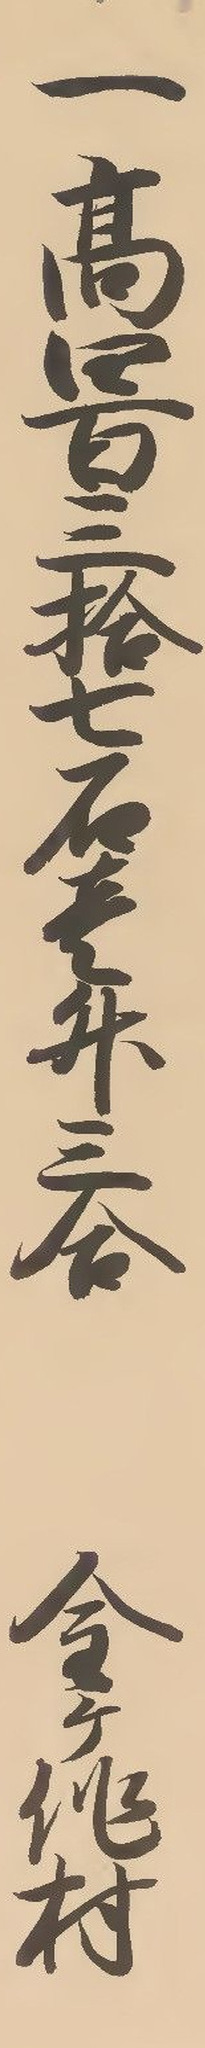一高四百三拾七石壱升三合金ヶ作村
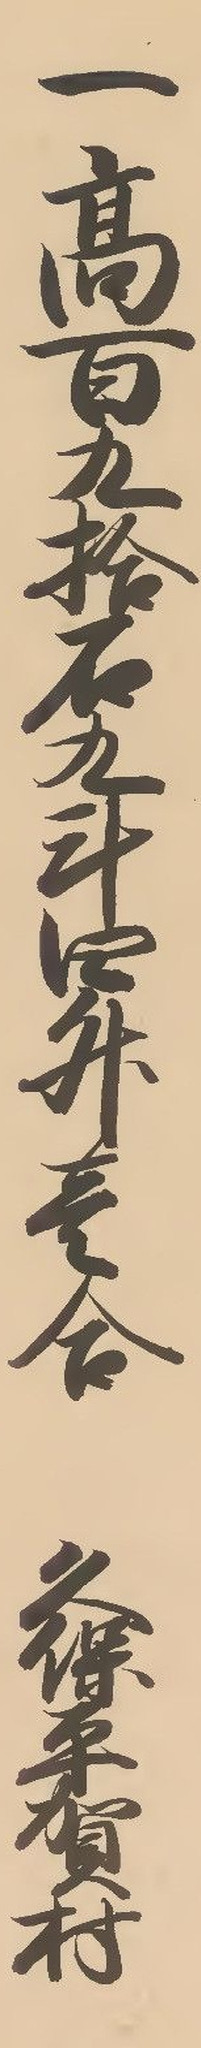一高百九拾石九斗四升壱合久保平賀村
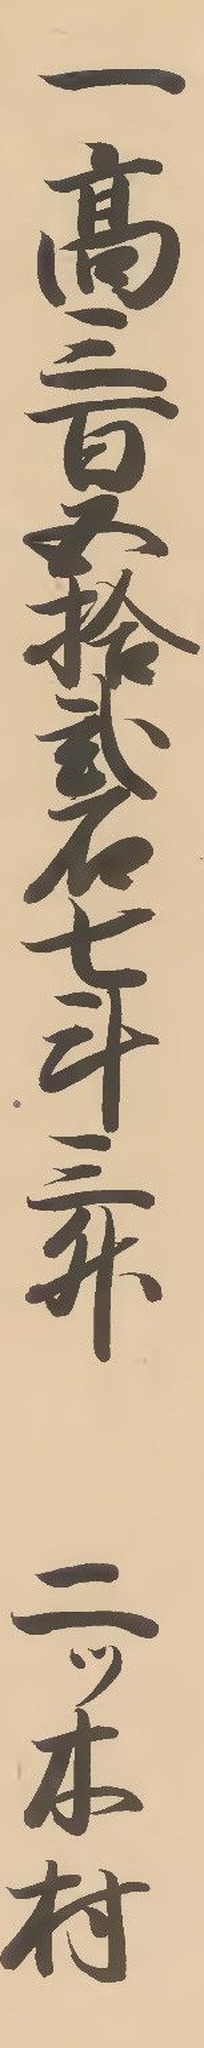一高三百五拾弐石七斗三升二ツ木村
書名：下総国郷帳
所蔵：国立公文書館 National Archives of Japan
